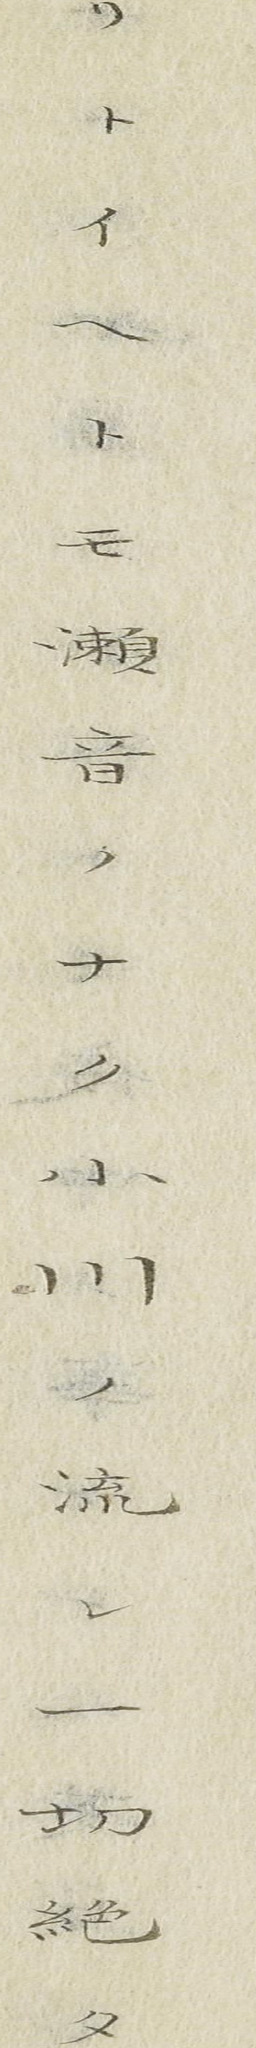リトイヘトモ瀬音ノナク小川ノ流レ一切絶タ
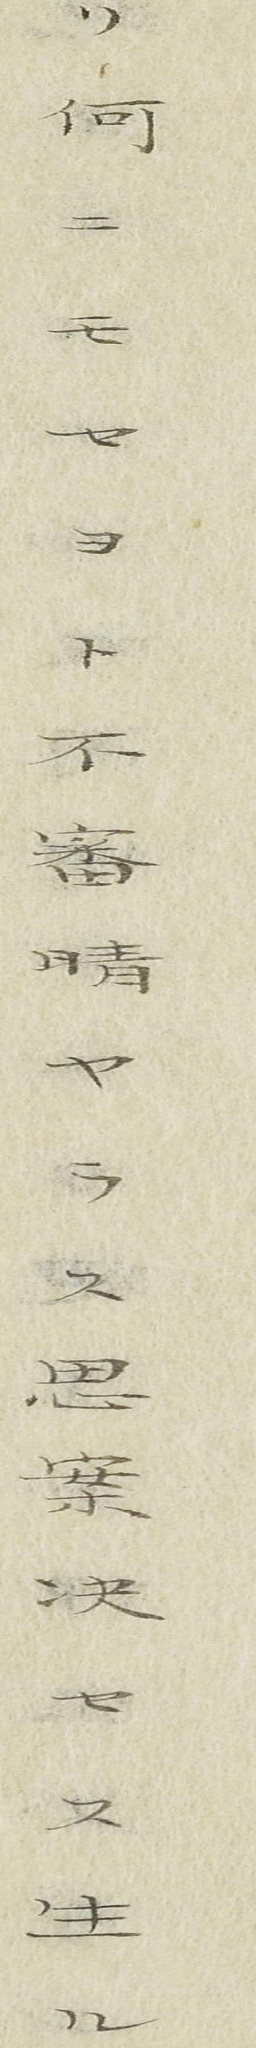リ何ニモセヨト不審晴ヤラス思案決セス生ル
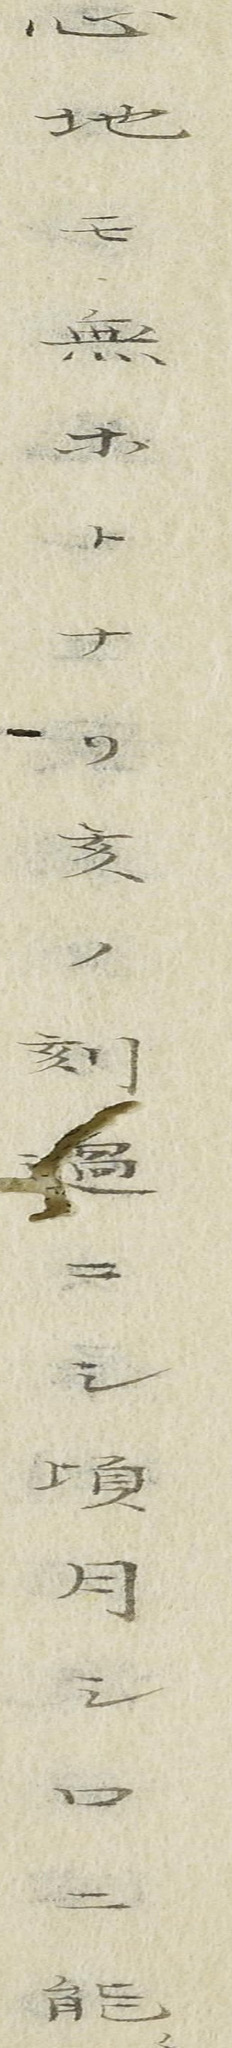心地モ無ホトナリ亥ノ刻過ニシ頃月シロニ能く

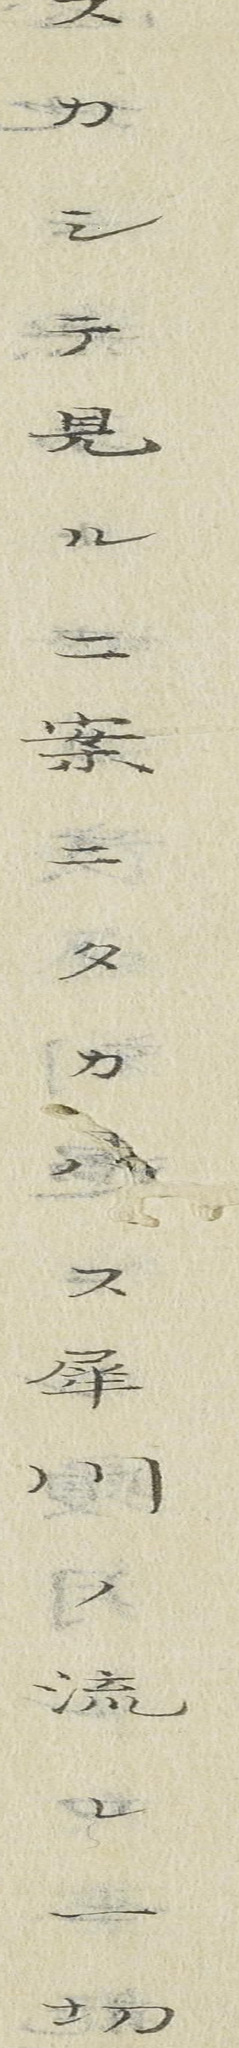スカシテ見ルニ案ニタカハス犀川ノ流レ一切
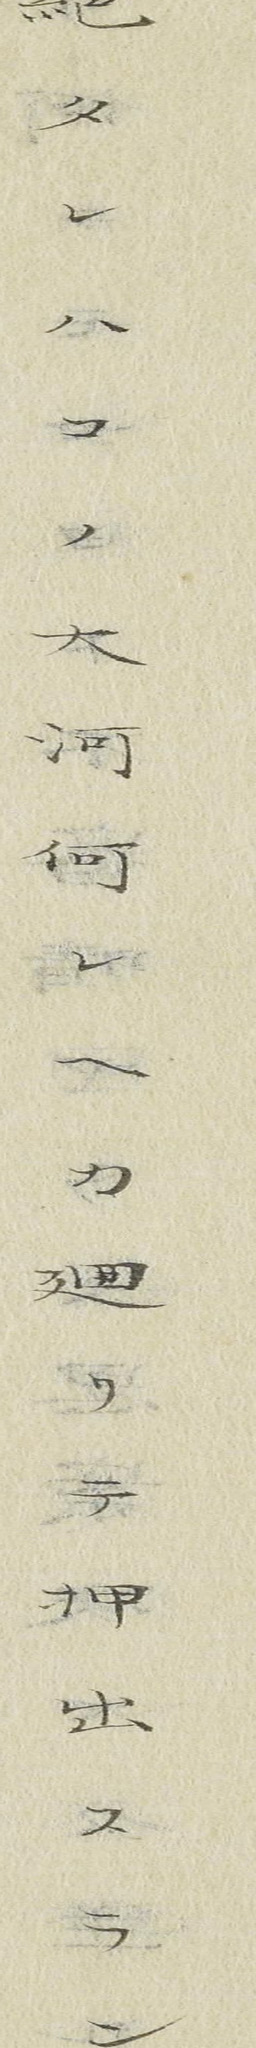絶タレハコノ大河何レヘカ廻リテ押出スラン
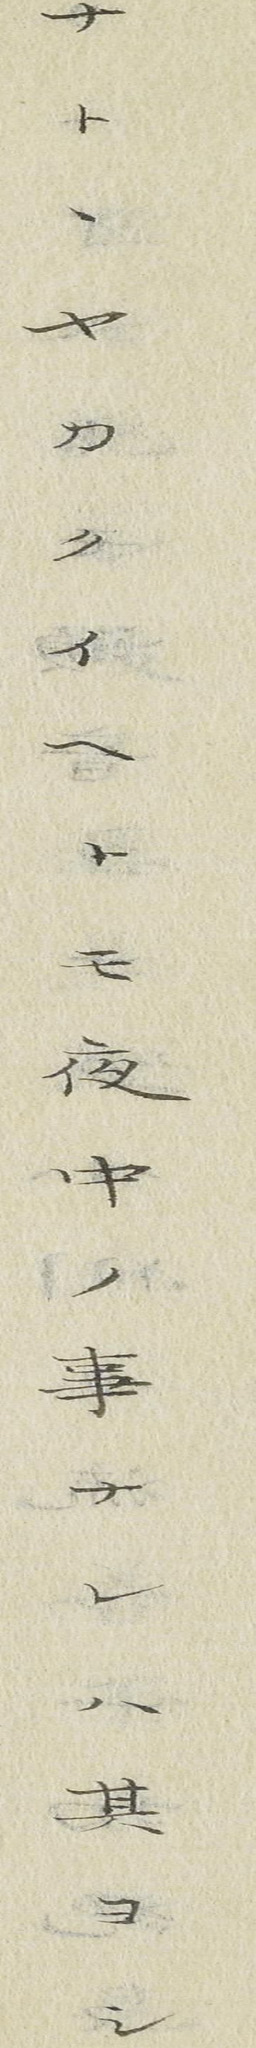ナトヽヤカクイヘトモ夜中ノ事ナレハ其ヨシ
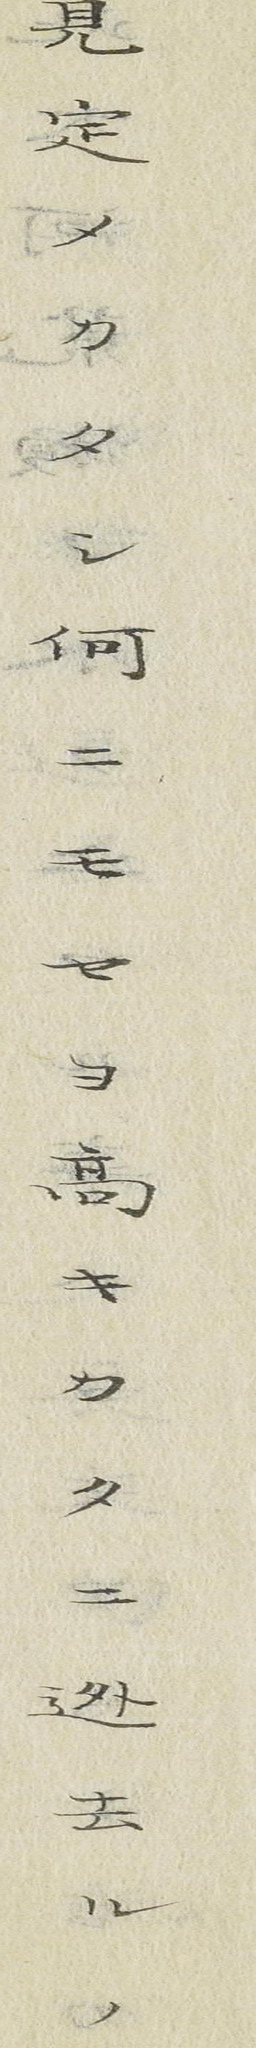見定メカタシ何ニモヤヨ高キカタニ逃去ルノ
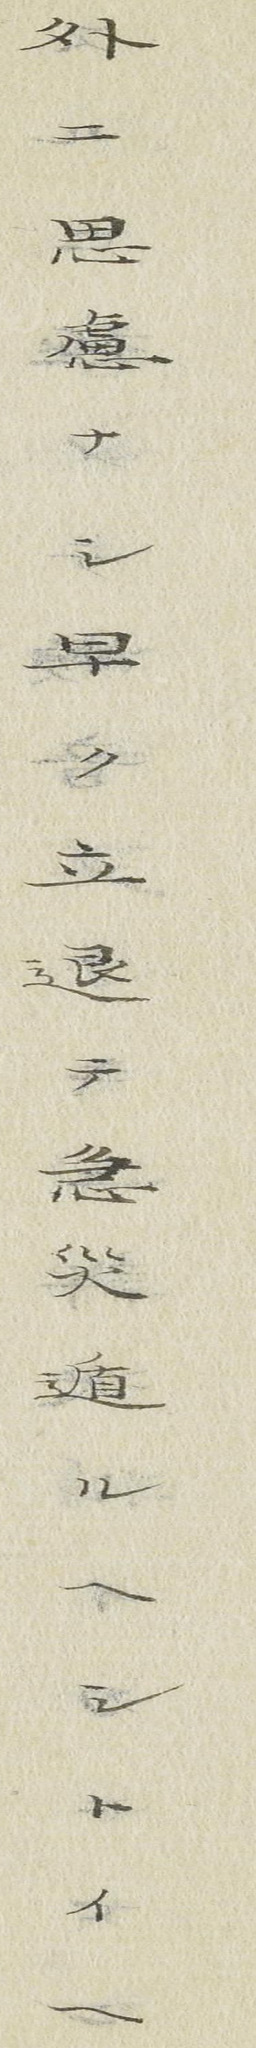外ニ思慮ナシ早ク立退テ急災遁ルヘシトイヘ
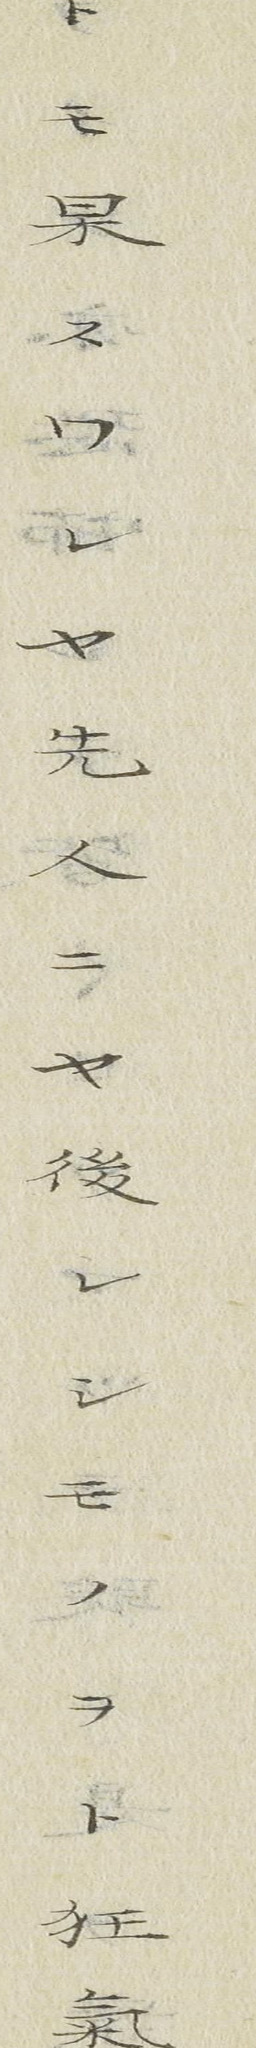トモ杲スワレヤ先人ニヤ後レシモノヲト狂気
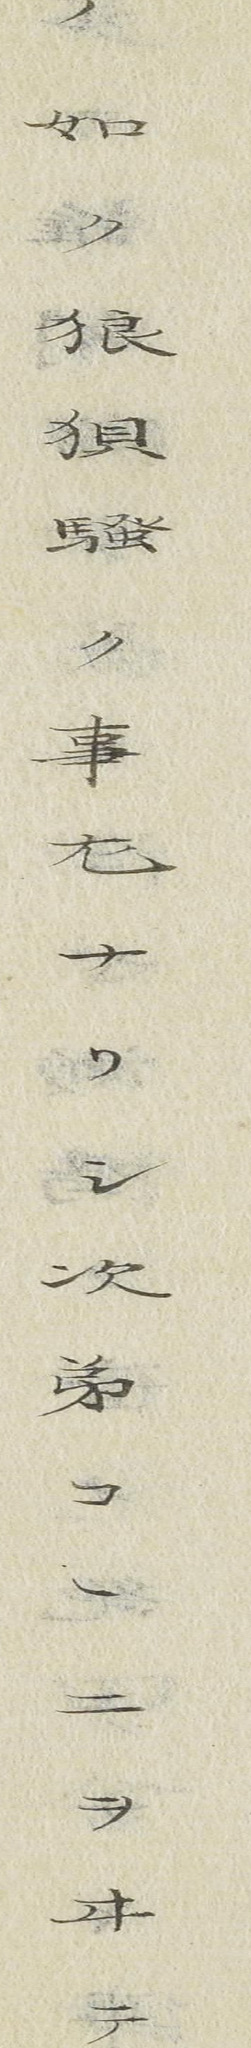ノ如ク狼狽騒ク事尤ナリシ次第コヽニヲヰテ
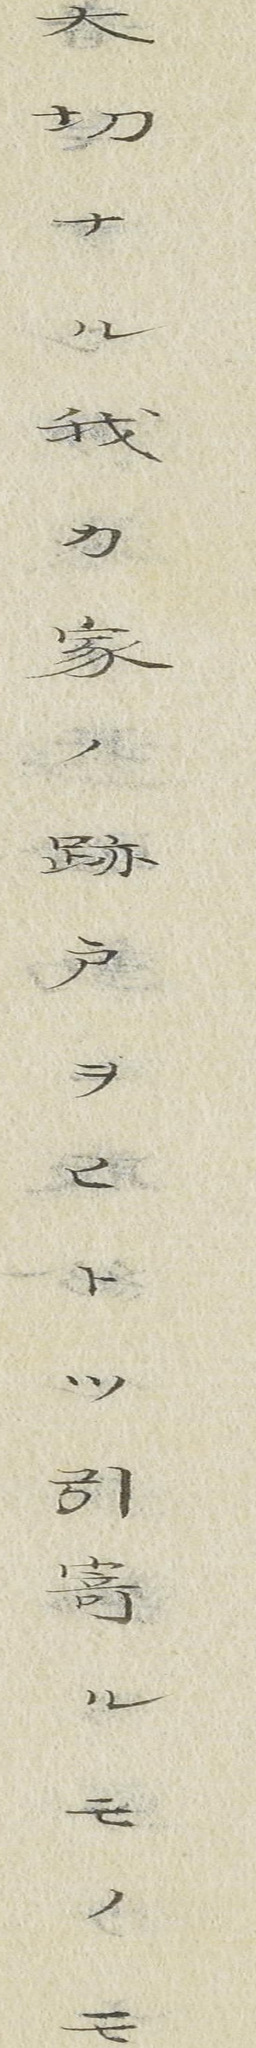大切ナル我カ家ノ跡戸ヲヒトツ引寄ルモノモ
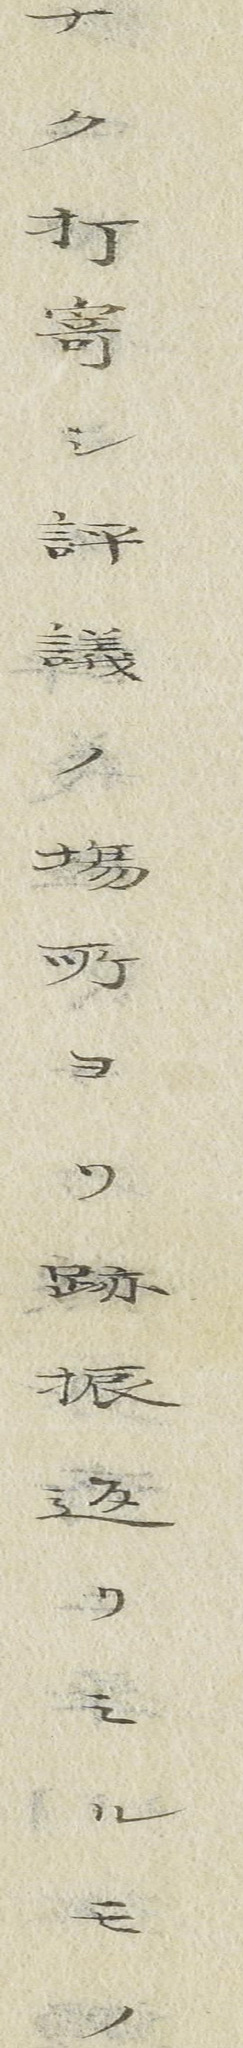ナク打寄シ評議ノ場所ヨリ跡振返リミルモノ
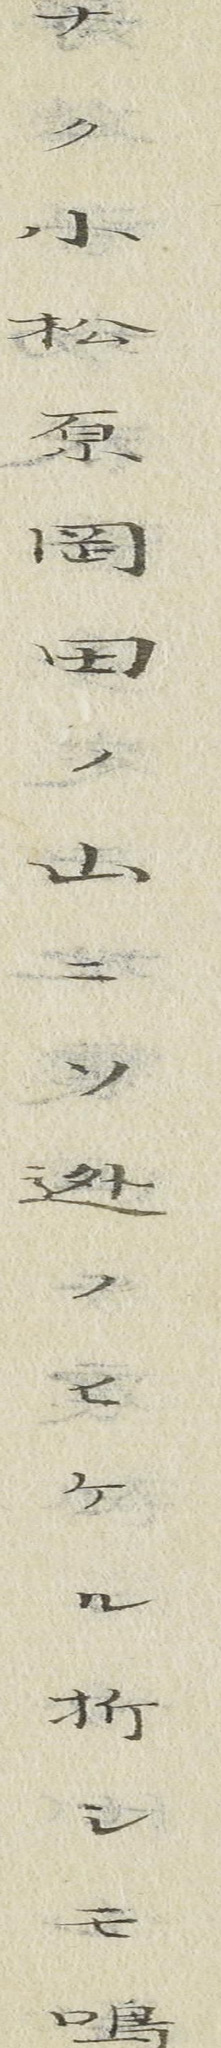ナク小松原岡田ノ山ニソ逃ノヒケル折シモ鳴
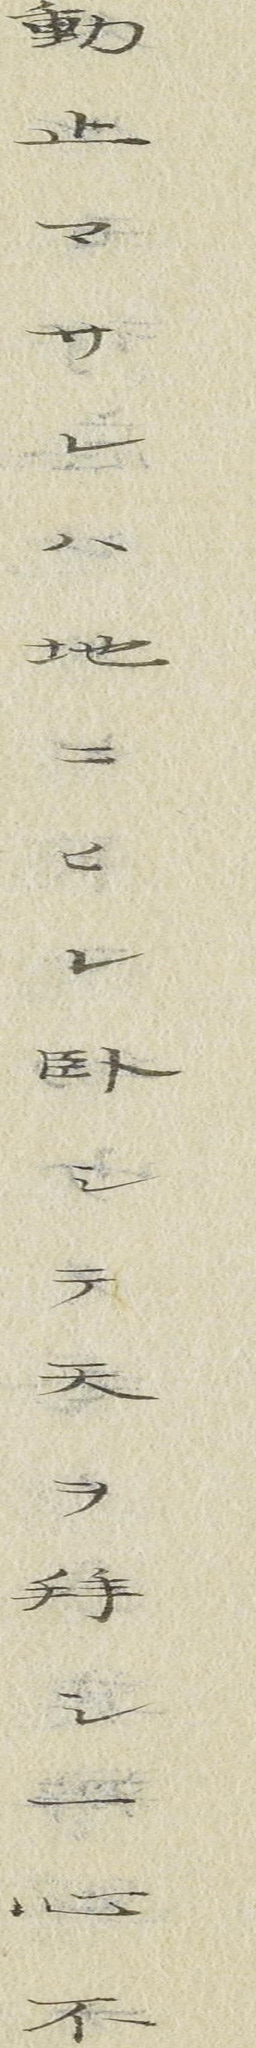動止マサレハ地ニヒレ卧シテ天ヲ拝シ一心不
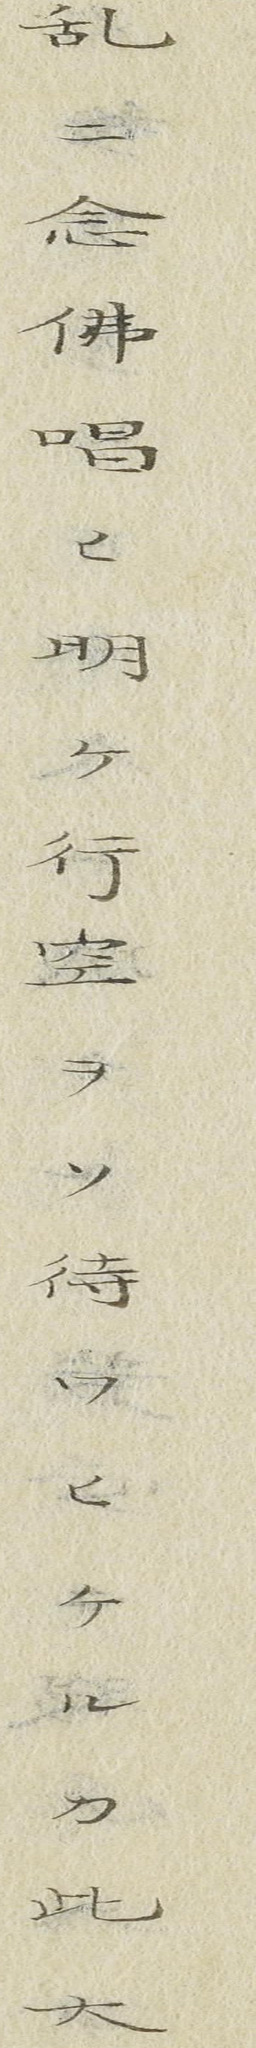乱ニ念仏唱ヒ明ケ行空ヲソ待ワヒケルカ此大
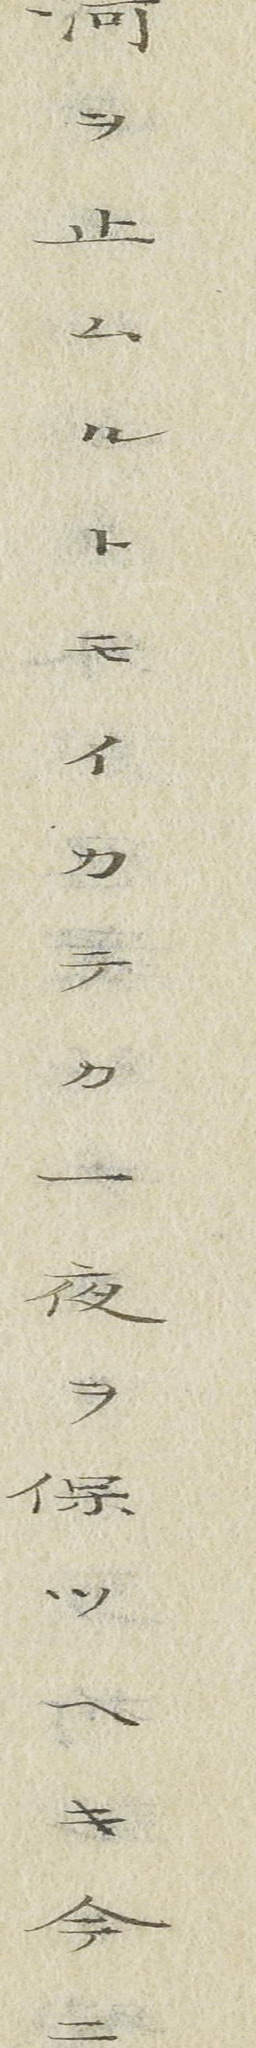河ヲ止ムルトモイカテカ一夜ヲ保ツヘキ今ニ
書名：地災撮要　地震之部　巻ノ二
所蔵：東京大学地震研究所図書室 Earthquake Research Institute Library, The University of Tokyo, JAPAN
